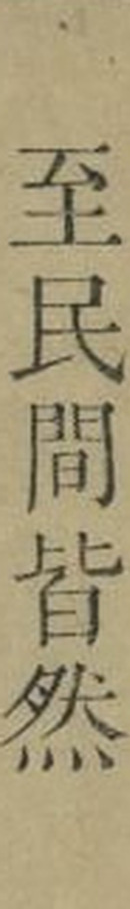至民間皆然
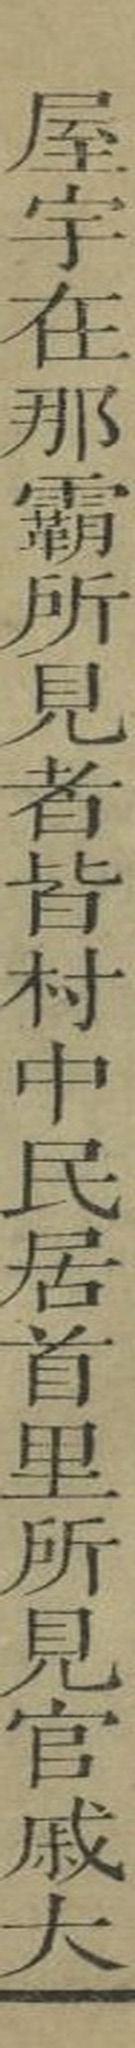屋宇在那霸所見者皆村中民居首里所見官戚大
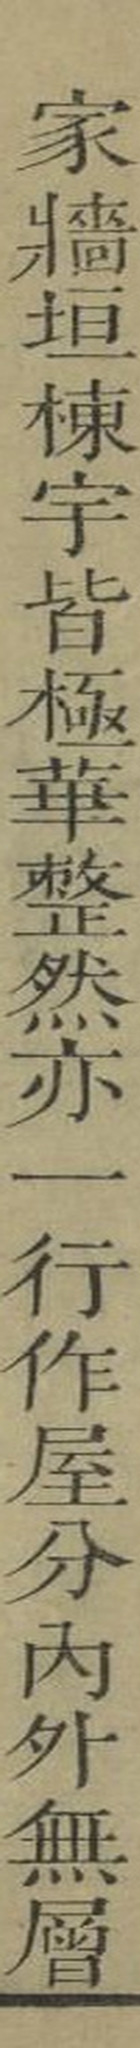家牆垣棟宇皆極華整然亦一行作屋分内外無層
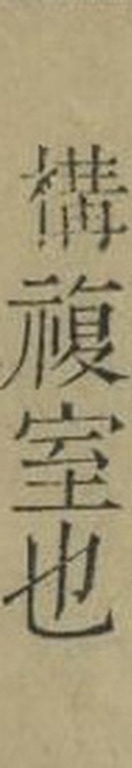構複室也
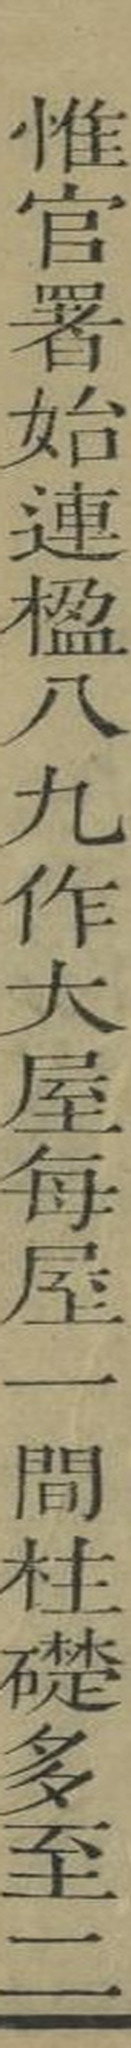惟官署始連楹八九作大屋毎屋一間柱礎多至二
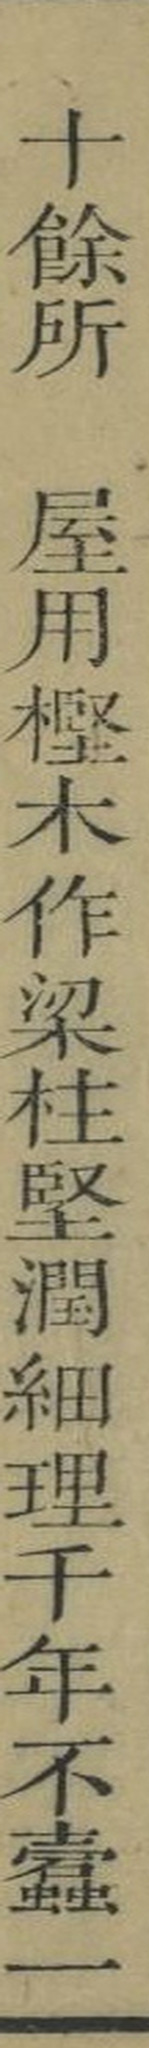十余所屋用樫木作梁柱堅潤細理千年不蠧一
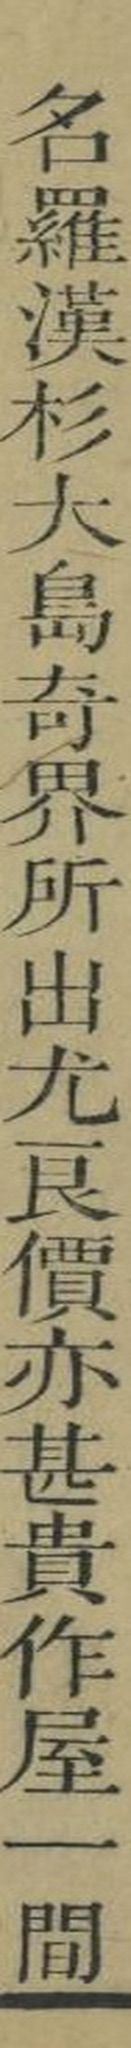名羅漢杉大島奇界所出尤良価亦甚貴作屋一間
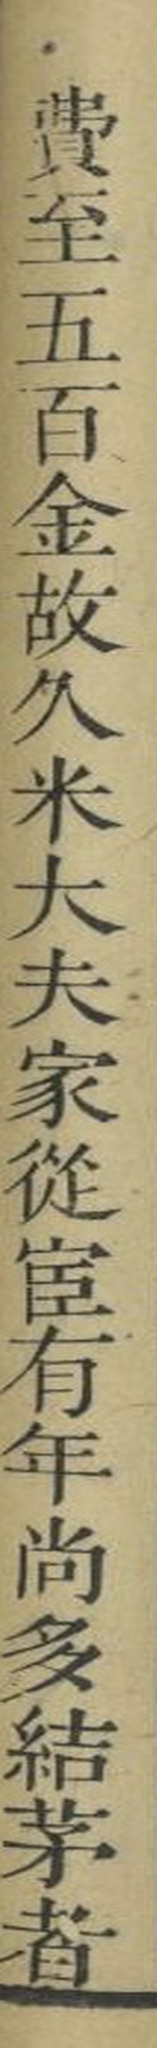費至五百金故久米大夫家従宦有年尚多結茅者
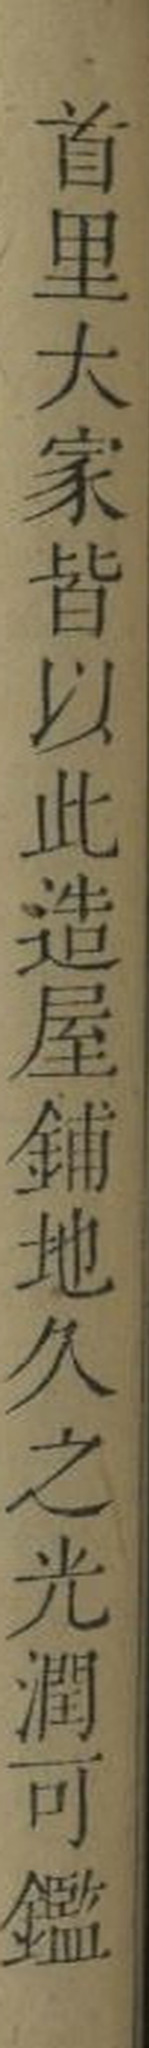首里大家皆以此造屋鋪地久之光潤可鑑
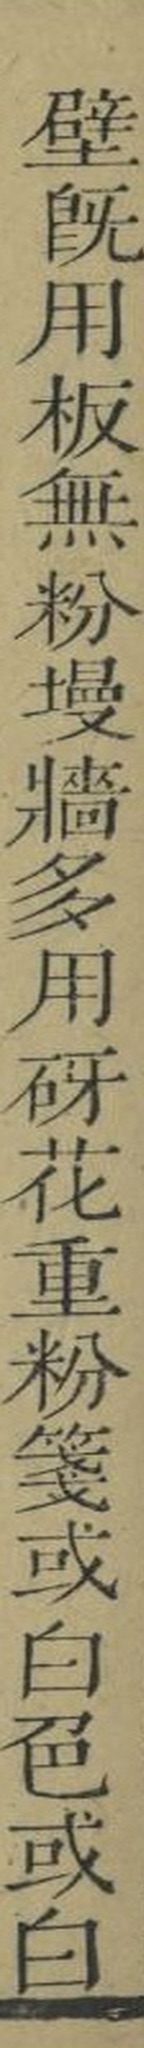壁既用板無粉墁牆多用砑花重粉箋或白色或白
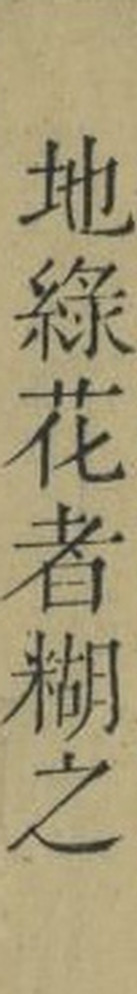地緑花者糊之
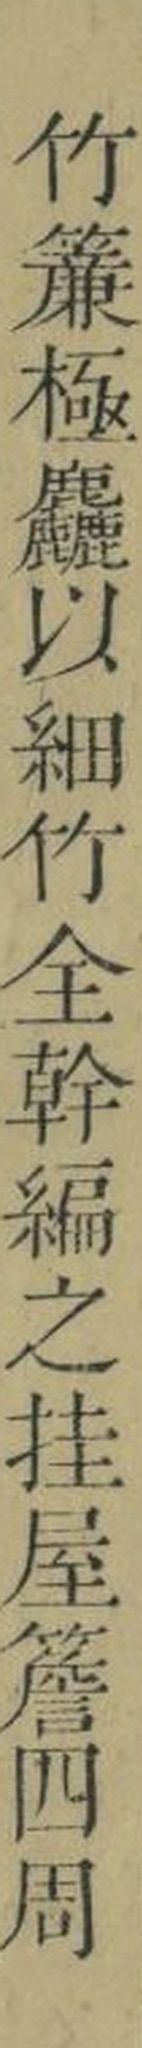竹簾極麤以細竹全幹編之挂屋簷四周
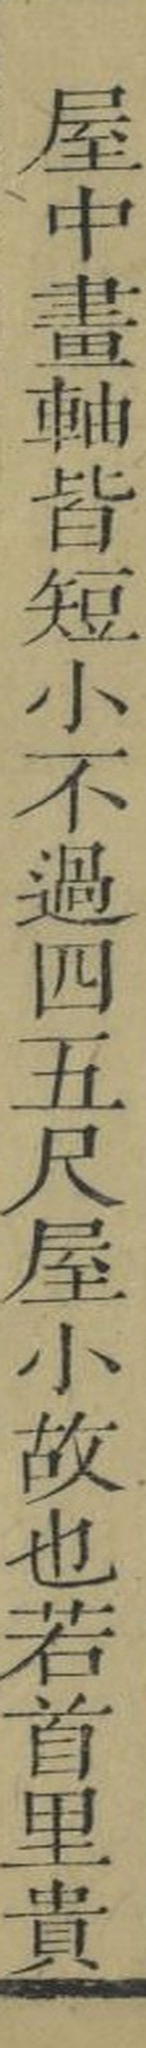屋中画軸皆短小不過四五尺屋小故也若首里貴
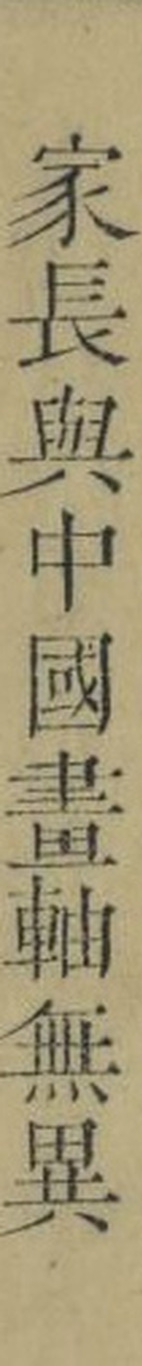家長与中国画軸無異
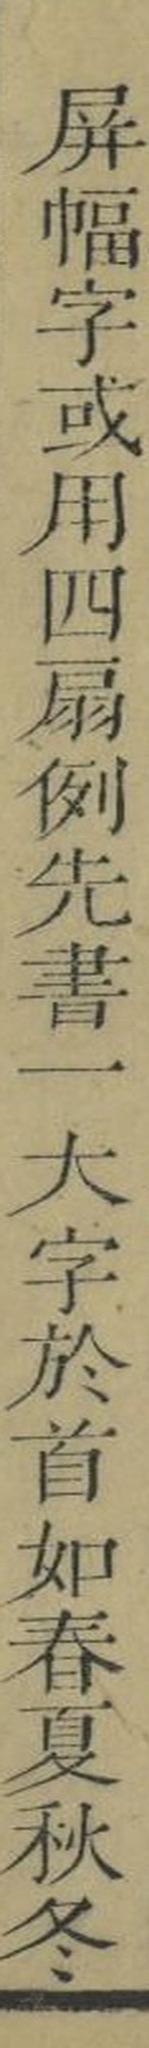屛幅字或用四扇例先書一大字於首如春夏秋冬
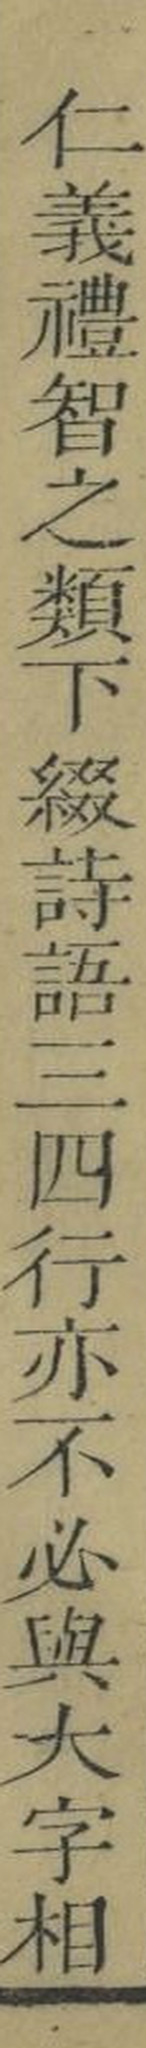仁義礼智之類下綴詩語三四行亦不必与大字相
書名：中山伝信録 巻六
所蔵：University of the Ryukyus Library
